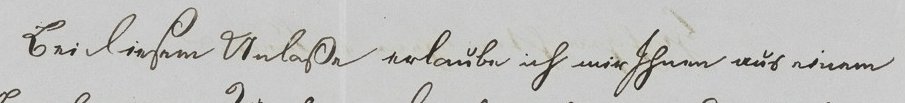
Bei diesem Anlasse erlaube ich mir Ihnen aus einem
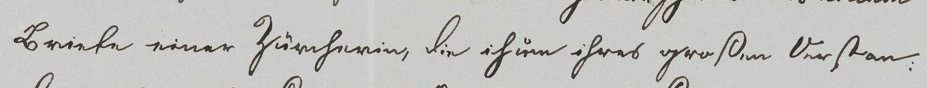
Briefe einer Zürcherin, die ich um ihres großen Verstan-
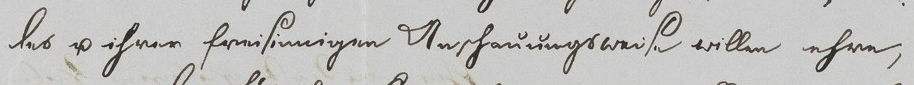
des& ihrer freisinnigen Anschauungsweise willen ehre,
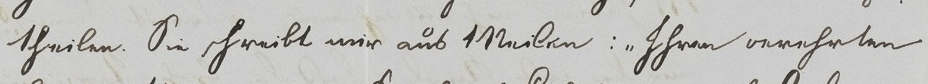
theilen. Sie schreibt mir aus Meilen: «Ihren verehrten
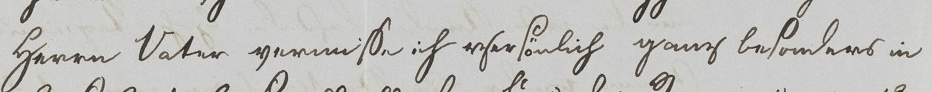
Herren Vater vermisse ich persönlich ganz besonders in
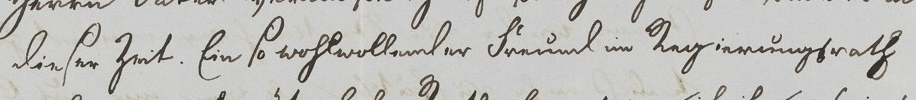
dieser Zeit. Ein so wohlwollender Freund im Regierungsrath
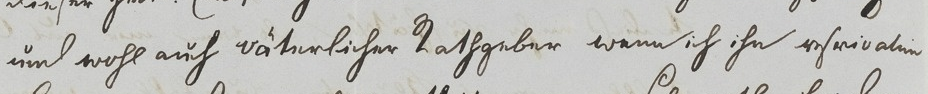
und wohl auch väterlicher Rathgeber wenn ich ihn privatim
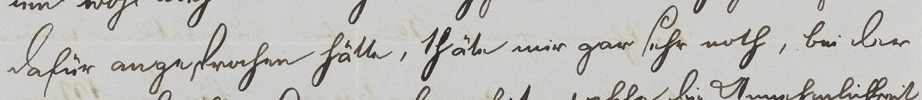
dafür angesprochen hätte, thäte mir gar sehr noth, bei der
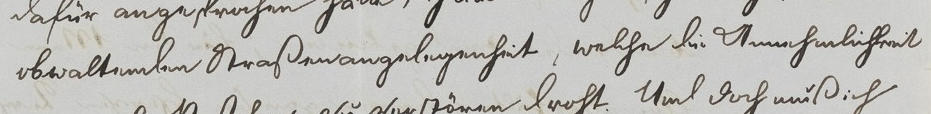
obwaltenden Straßenangelegenheit, welche die Annehmlichkeit
